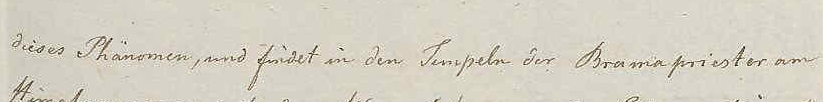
dieses Phänomen, und findet in den Tempeln der Bramapriester am
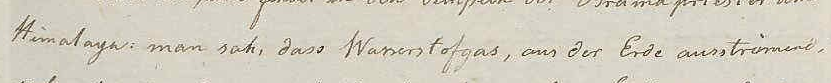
Himalaya: man sah, dass Wasserstofgas, aus der Erde ausströmend,
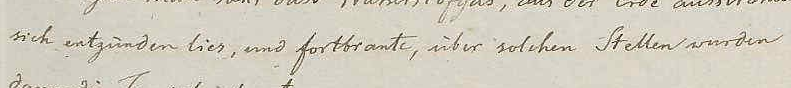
sich entzünden lies, und fortbrante, über solchen Stellen wurden
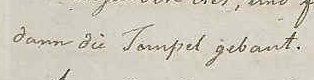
dann die Tempel gebaut.
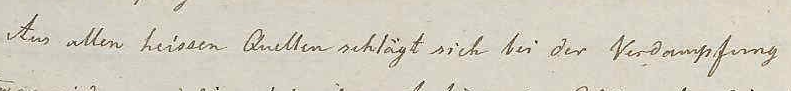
Aus allen heissen Quellen schlägt sich bei der Verdampfung
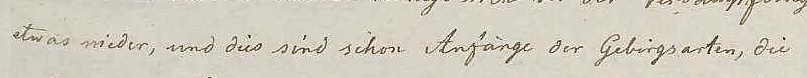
etwas nieder, und dies sind schon Anfänge der Gebirgsarten, die
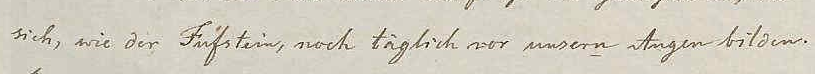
sich, wie der FTufstein, noch täglich vor unsern Augen bilden.
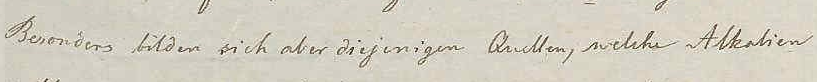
Besonders bilden sich aber diejenigen Quellen, welche Alkalien
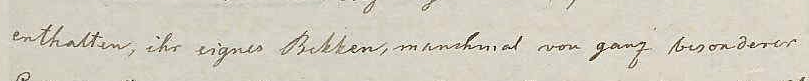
enthalten, ihr eignes Bekken, manchmal von ganz besonderer
